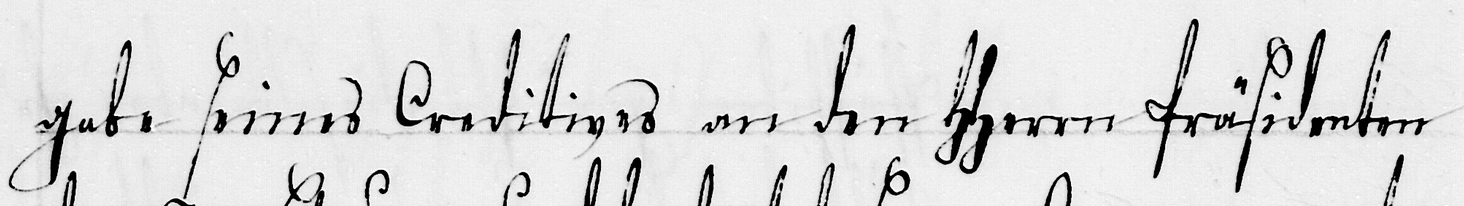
gabe seines Creditives an den HHerrn Präsidenten
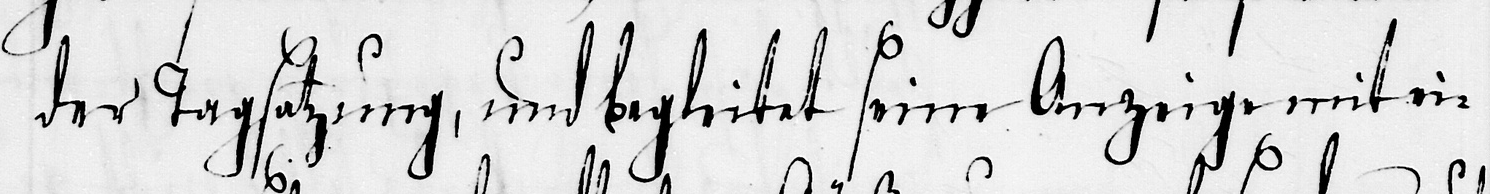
der Tagsatzung, und begleitet seine Anzeige mit ei¬
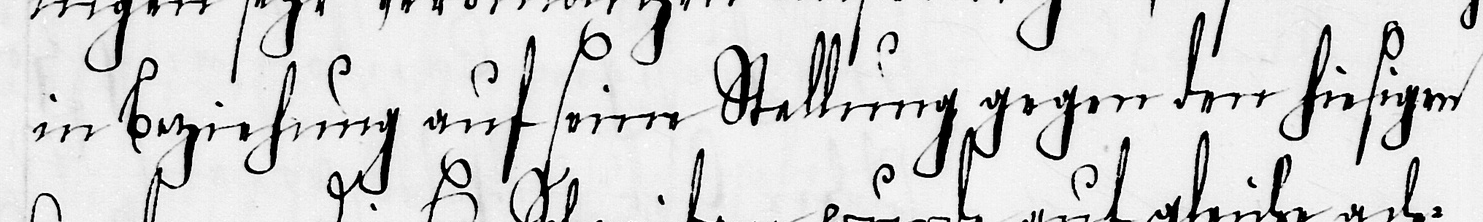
in Beziehung auf seine Stellung gegen den hiesigen
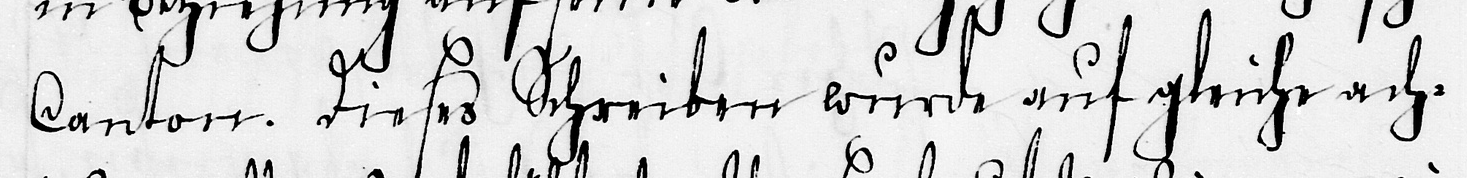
Canton. Dieses Schreiben wurde auf gleiche ach¬
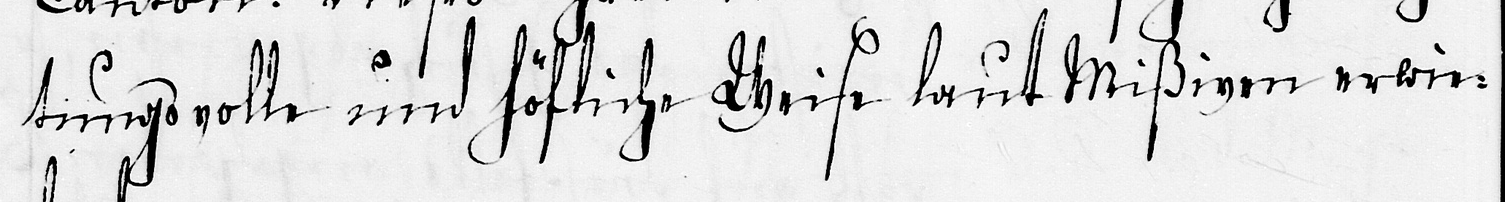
tungsvolle und höfliche Weise laut Mißiven erwie¬
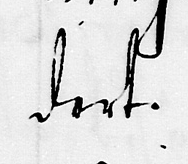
dert.
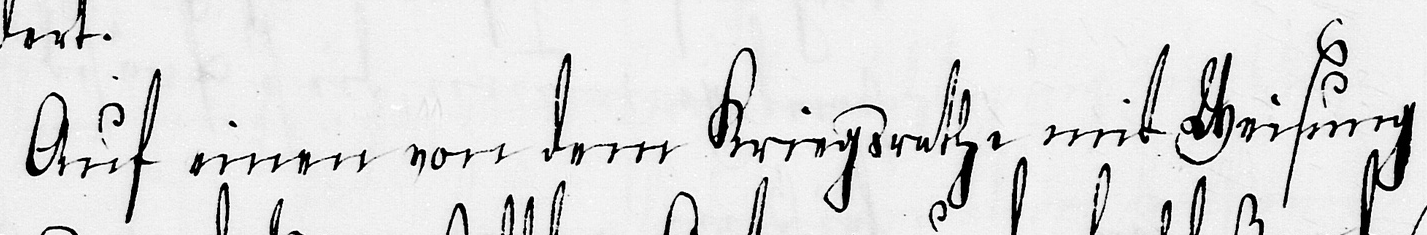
Auf einen von dem Kriegsrathe mit Weisung
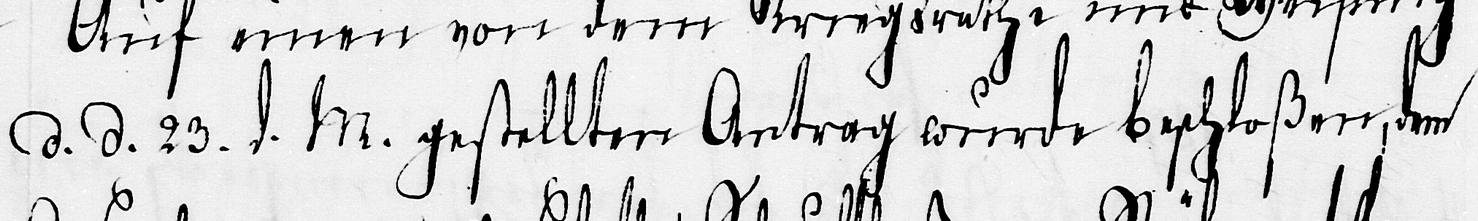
d. d. 23. d. M. gestellten Antrag wurde beschloßen, dem
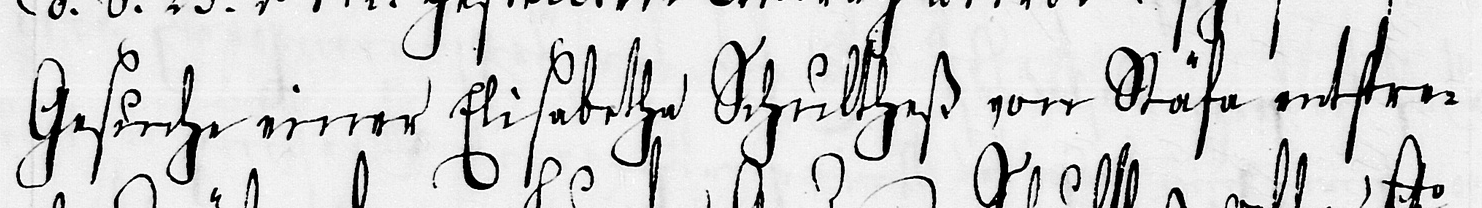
Gesuche einer Elisabetha Schultheß von Stäfa entspre¬
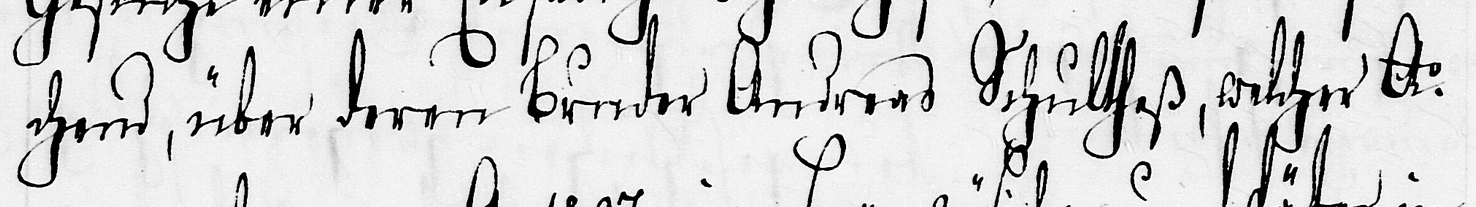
chend, über deren Bruder Andreas Schultheß, welcher Ao.
